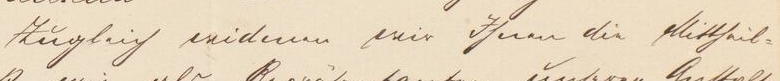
Zugleich widmen wir Ihnen die Mittheil-
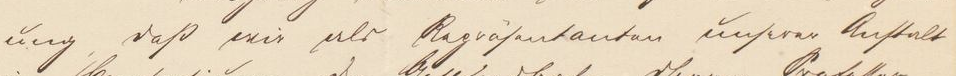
ung, daß wir als Repräsentanten unserer Anstalt
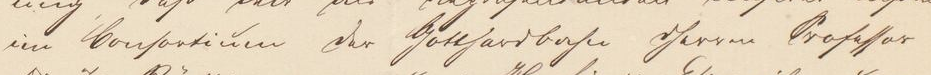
im Consortium der Gotthardbahn die Herren Professor
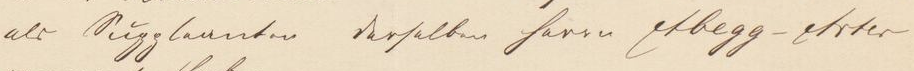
als Suppleanten derselben Herrn Abegg-Arter
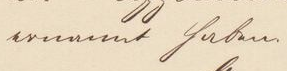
ernannt haben –
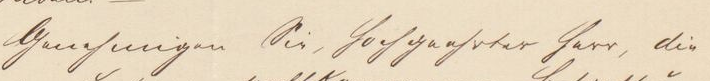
Genehmigen Sie, hochgeachteter Herr, die
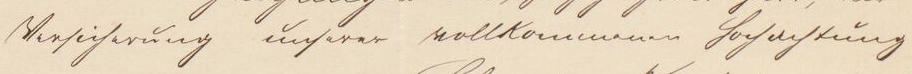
Versicherung unserer vollkommenen Hochachtung
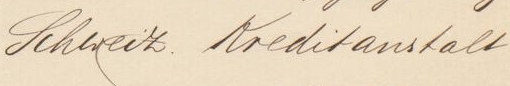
Schweiz. Kreditanstalt
